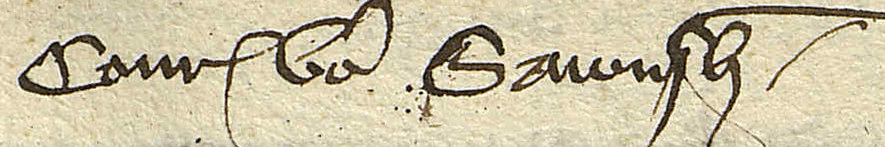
Conr* vo* Sawnſh* /
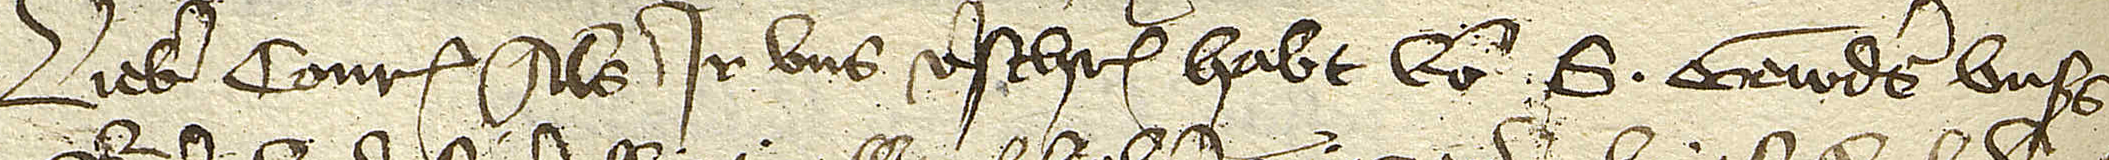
Lieb* Conr* Als Ir vns v*ſchr* habt vo* S . Gewds* vnſ*s
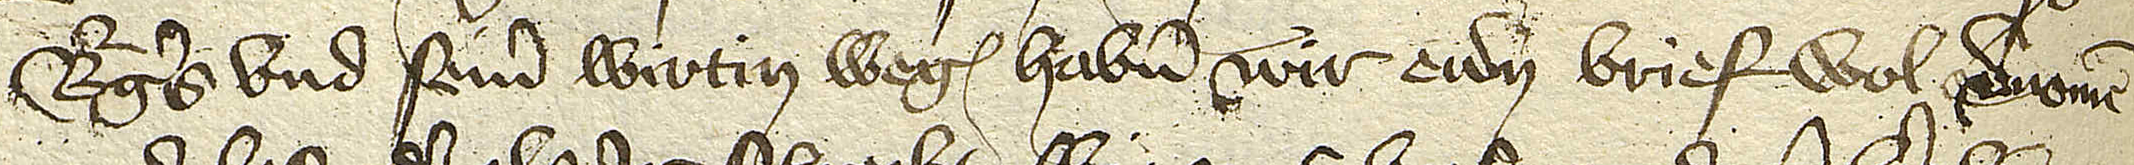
B*g*s vnd ſein* wirtin weg* habn* wir ew*n brief wol v*nome*
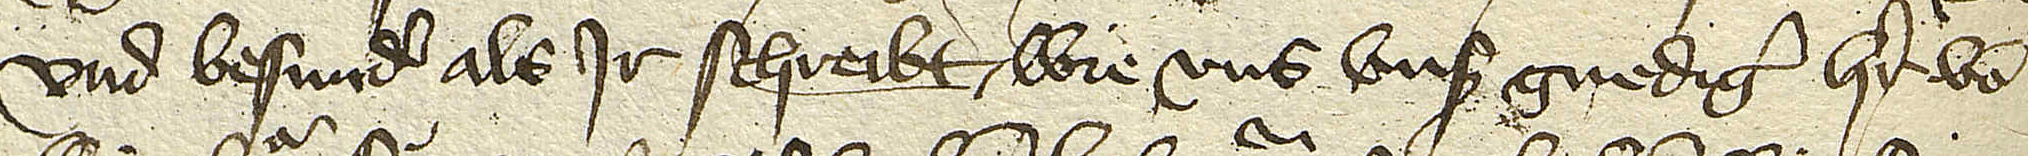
vnd beſund* als Ir ſchreibt / wie vns vnſ* gnedig* hr* vo*
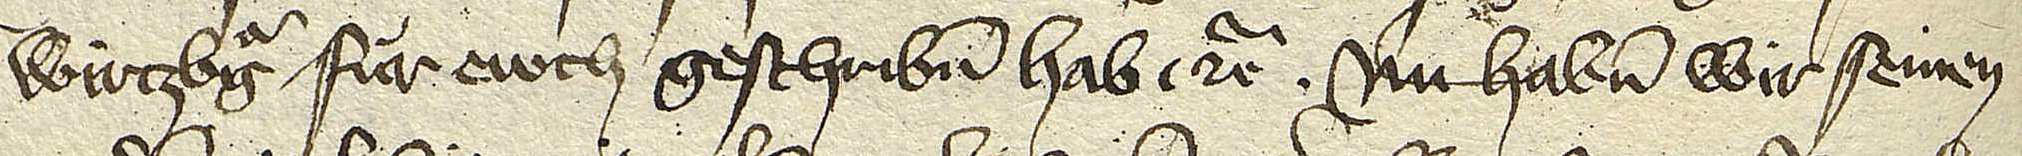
wircʒb*g / für ewch geſchribn* hab / ec* . Nu habn* wir ſeinen
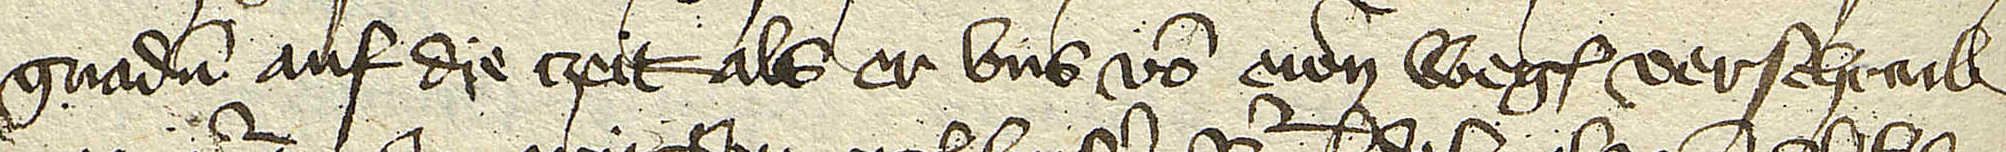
gnadn* auf die cʒeit als er vns vo* ew*n weg* verſchraib
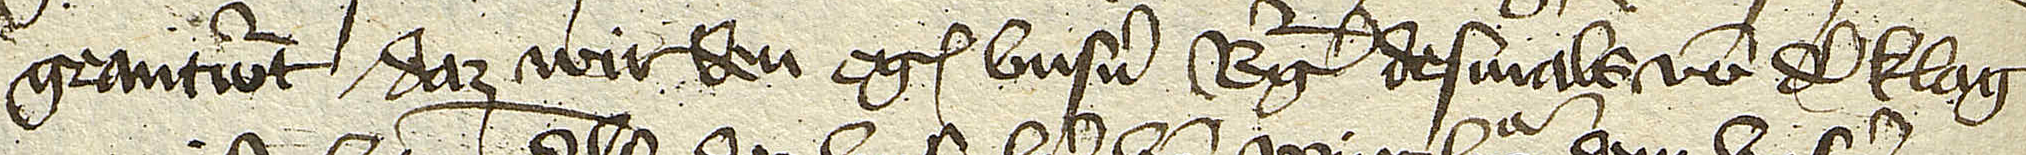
geantwt* / daʒ wir den eg* vnſn* B*g* deſmals vo* d* klag
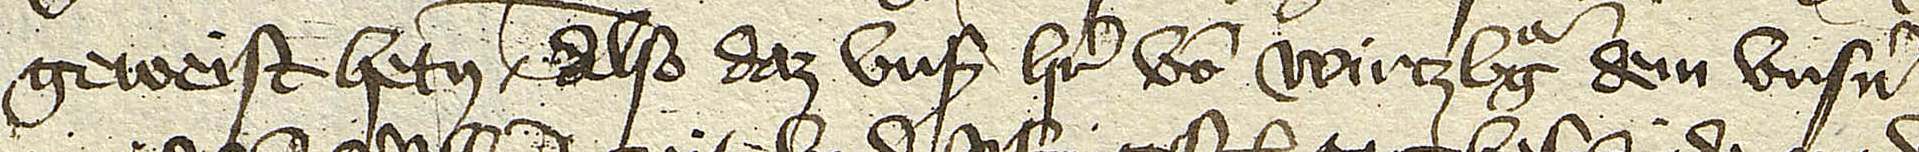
geweiſt hetn* / Alſo daʒ vnſ* hr* vo* wircʒb*g dem vnſn*
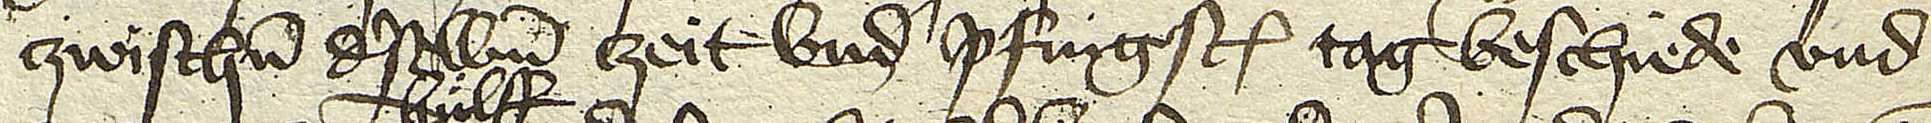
cʒwiſchn* d*ſelbn* cʒeit vnd pfingſt* tag beſchiede vnd
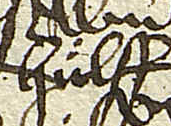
hülff
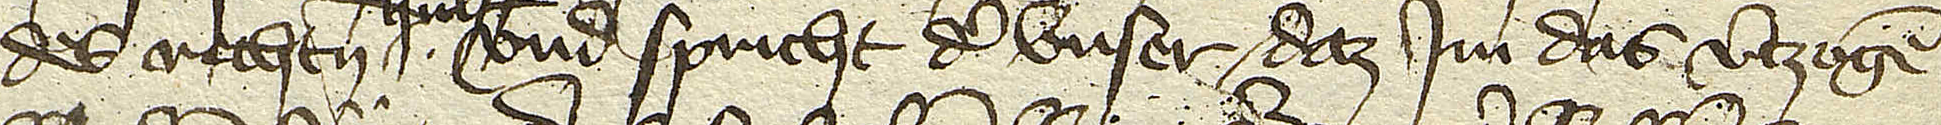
des rechtn* / . vnd ſpricht d* vnſer / daʒ Im das v*cʒoge*
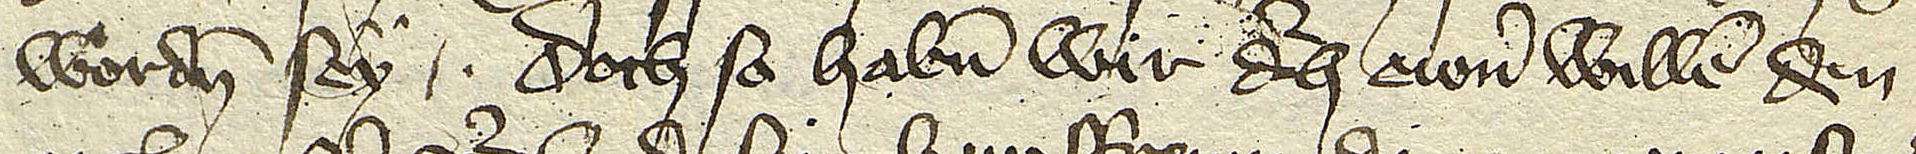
wordn* ſey / . Doch ſo habn* wir d*h ewn* wille* den
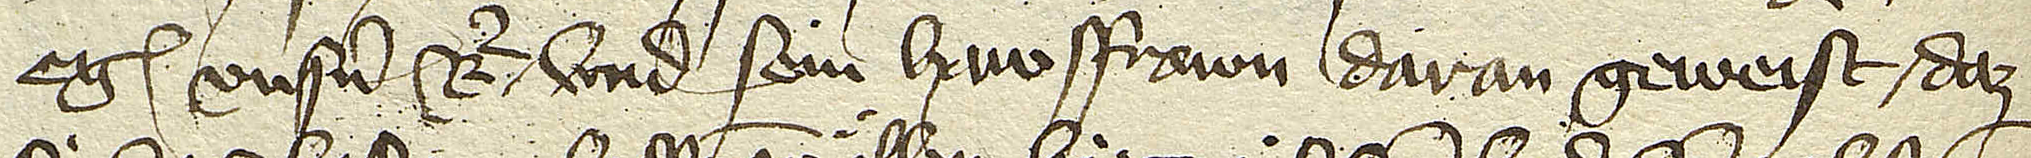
eg* vnſn* B* vnd ſein hawſfrawn daran geweiſt / daʒ
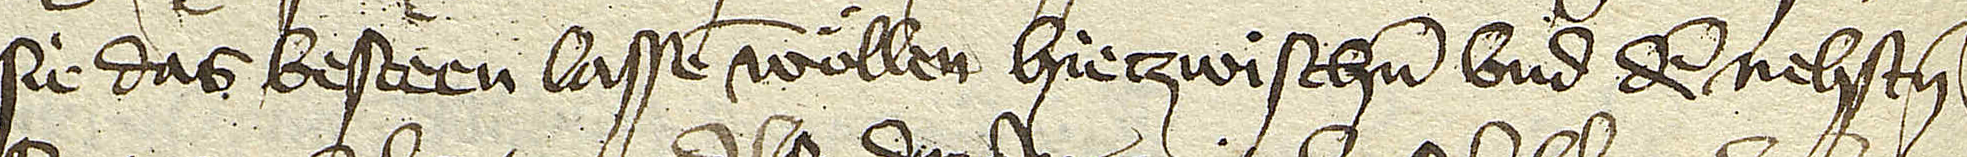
ſie das beſteen laſſe* wöllen hiecʒwiſchn* vnd d* nehſtn*
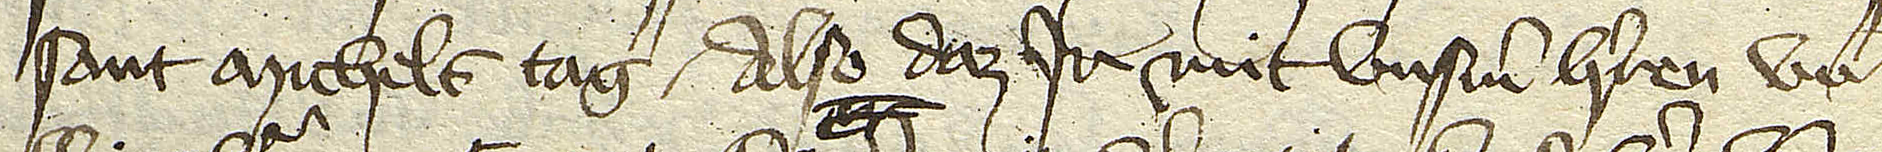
ſant Michels tag / Alſo daʒ Ir mit vnſm* h*ren vo*
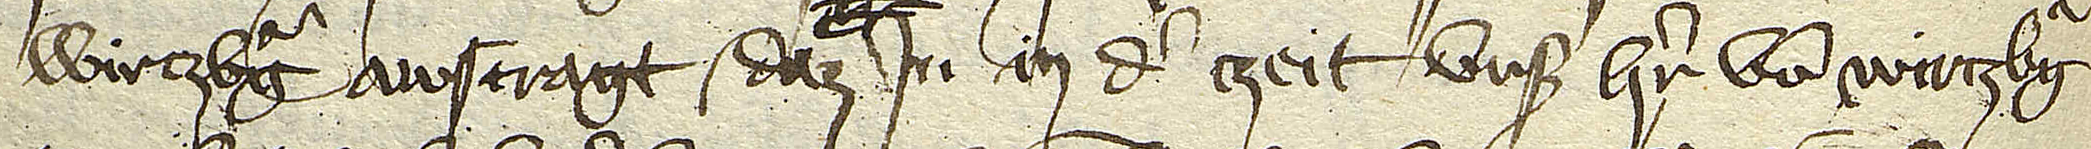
wircʒb*g awſtragt / daʒ In in d* cʒeit vnſ* hr* vo* wircʒb*g
